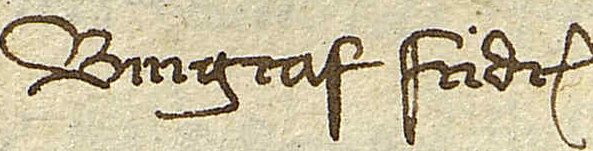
Burgraf fridr*
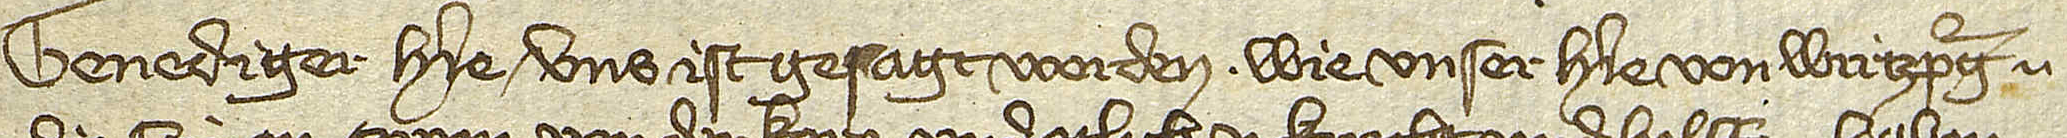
Gnediger h*re / vns iſt geſagt worden . wie vnſer h*re von wircʒp*g ~
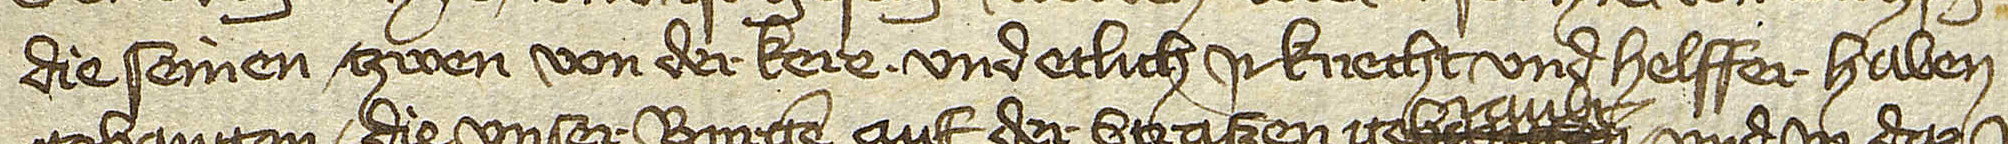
die ſeinen / cʒwen von der kere . vnd etlich Ir knecht vnd helffer haben
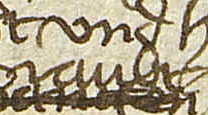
raubt
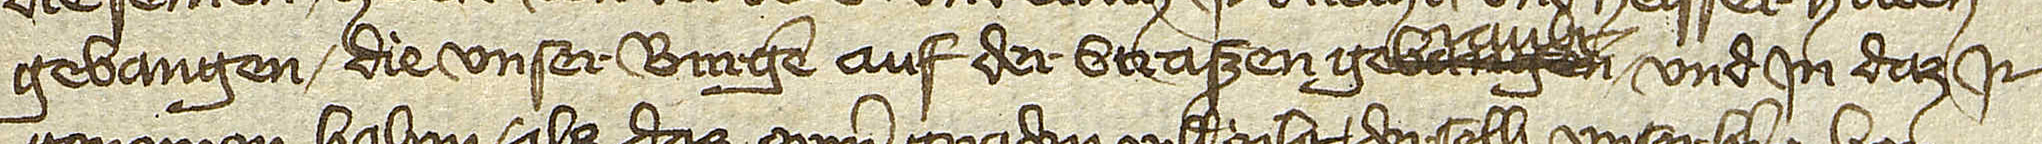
gevangen / die vnſer Burge* auf der Straſʒen gevangen / vnd In daʒ Ir
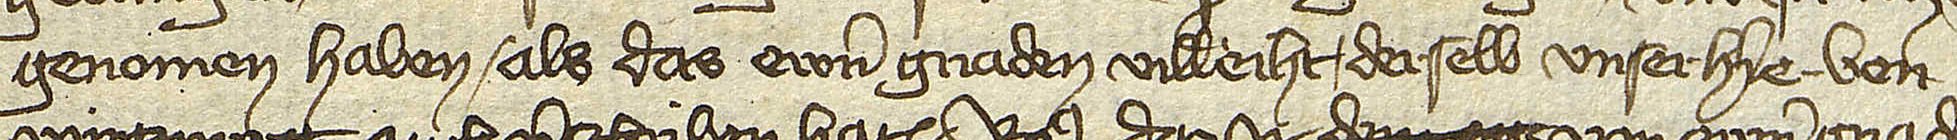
genomen haben / als das ewn* gnaden villeiht / derſelb vnſer h*re ~ von
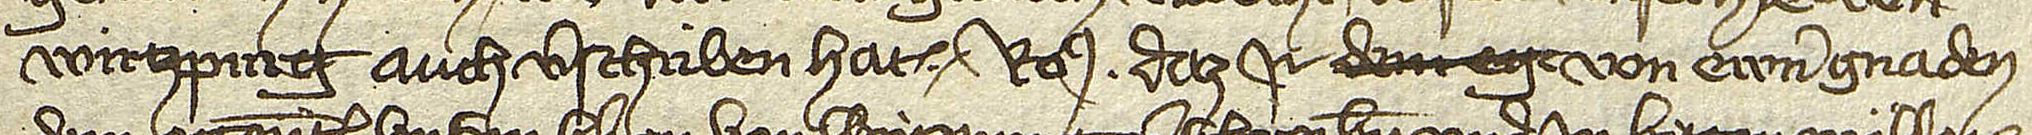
wircʒpurg auch v*ſchriben hat . / Ro* . daʒ Ir dem eg* von ewn* gnaden
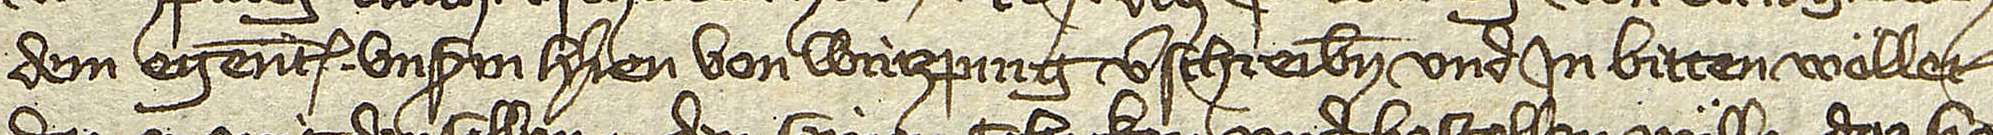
den egent* . vnſ*m h*ren von wircʒpurg v*ſchreibn* vnd In bitten wöllet
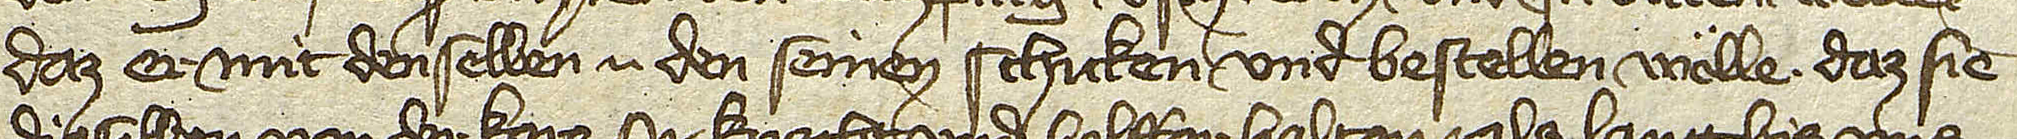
daʒ er mit denſelben ~ den ſeinen ſchicken vnd beſtellen wölle . daʒ ſie
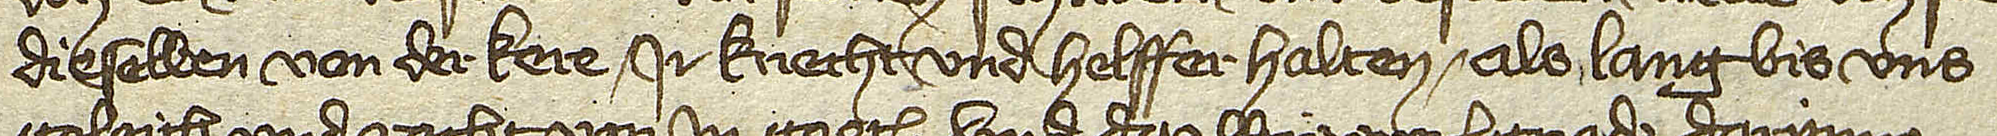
dieſelben von der kere / Ir knecht vnd helffer halten / als lang bis vns
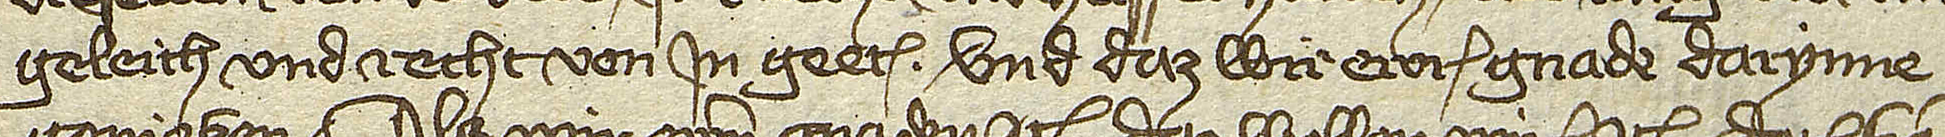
geleich vnd recht von In geet* . / vnd daʒ wir ewr* gnade darynne
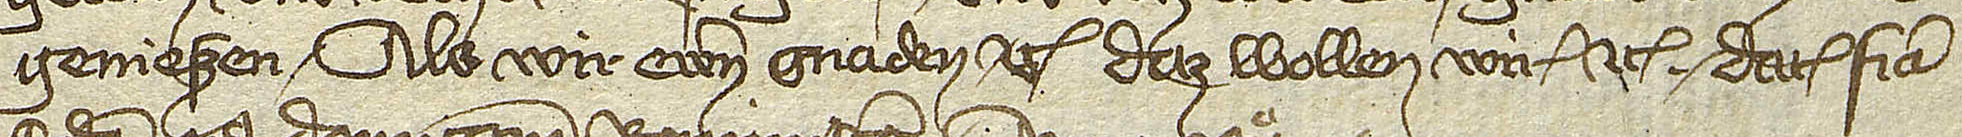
genieſʒen / Als wir ew*n gnaden ec* daʒ wollen wir ec* . / dat* fia*
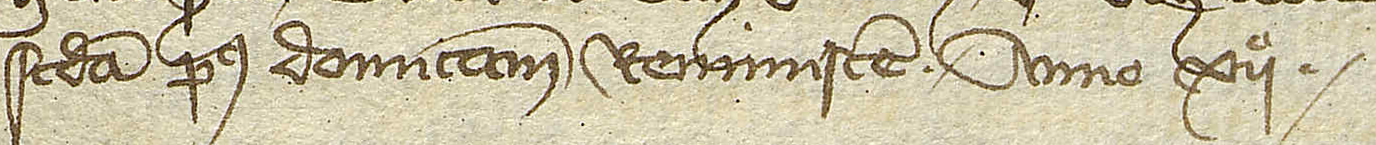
ſcda* p* domican* Reminiſce* . / Anno xii* . /
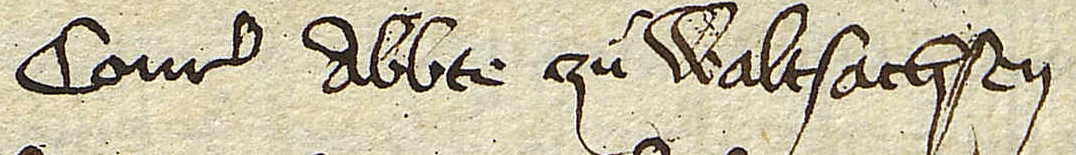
Conr* Abbte cʒü Waltſachſen
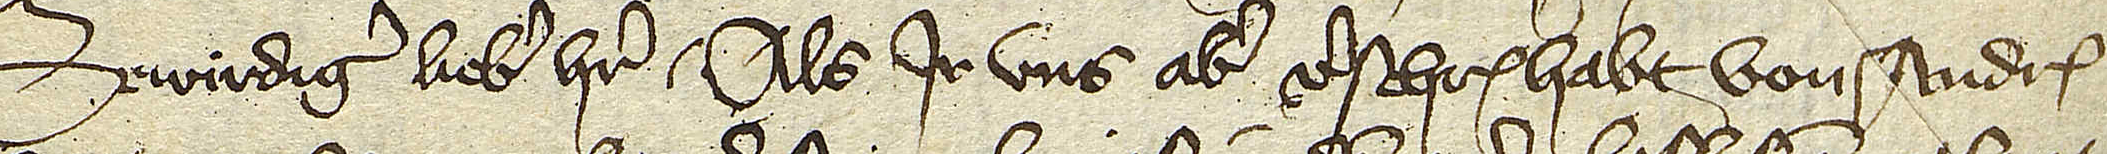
Erwirdig* lieb* hr* / Als Ir vns ab* v*ſchr* habt von Andr*
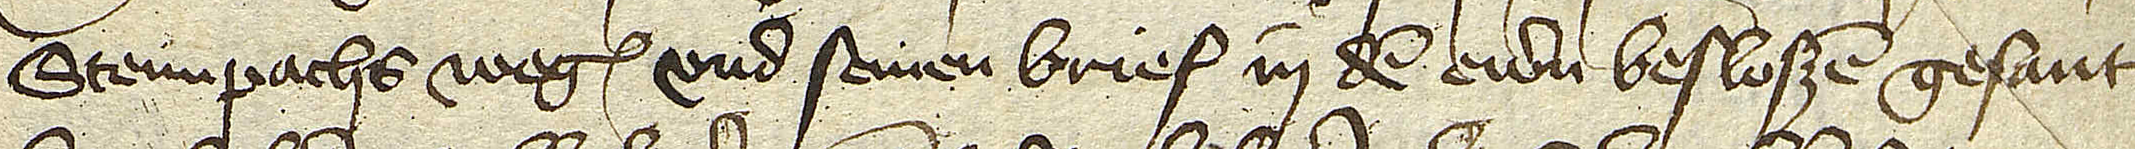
Steimpachs weg* vnd ſeinen brief in d* ew*n beſloſʒe* geſant
